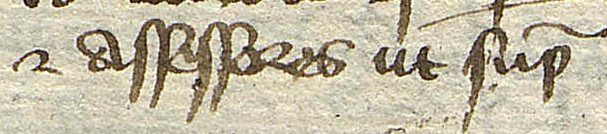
@ Aſſeſſores ut ſup*
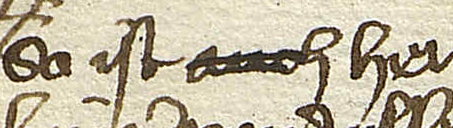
So iſt auch her
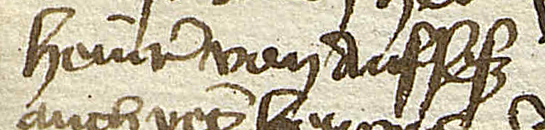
heinr* von Aufſeſʒ
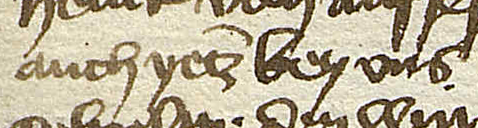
auch yecʒ* bey vns
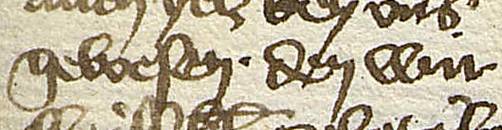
geweſen . den wir
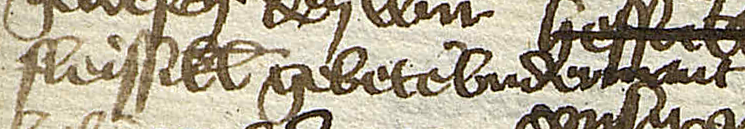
fleiſſikl* gebete* vnd ermant
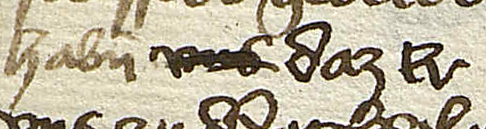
hab*n vns daʒ Er
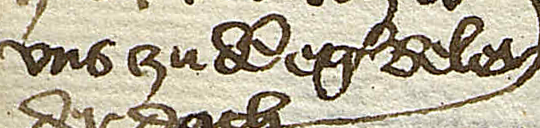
vns cʒu d* eg* Beler
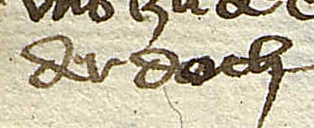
der doch
